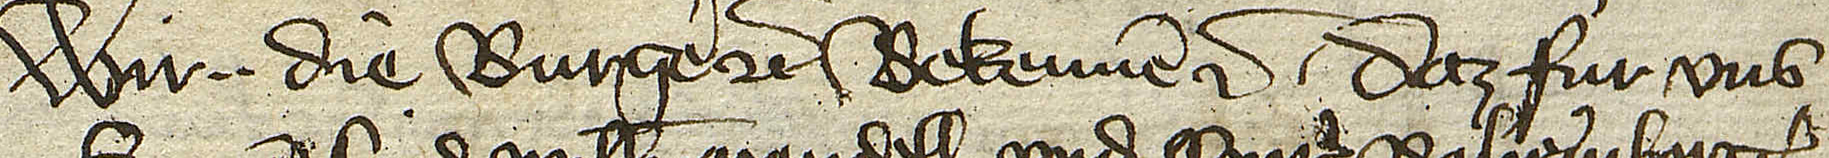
Wir ~ die Burge* ec* Bekenne* ec* / Daʒ für vns
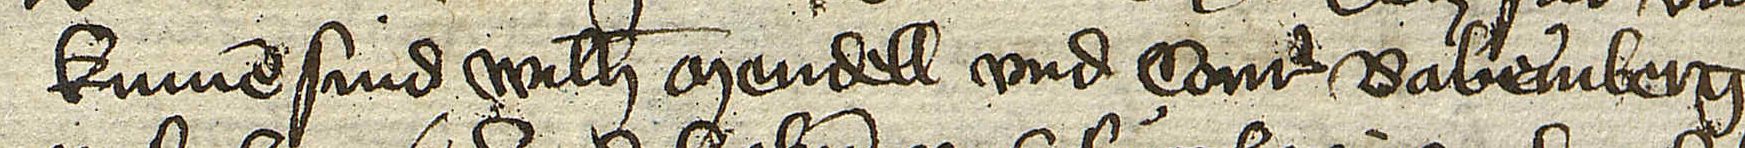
kume* ſind wilh* Mendell vnd Conr* Babemberg*
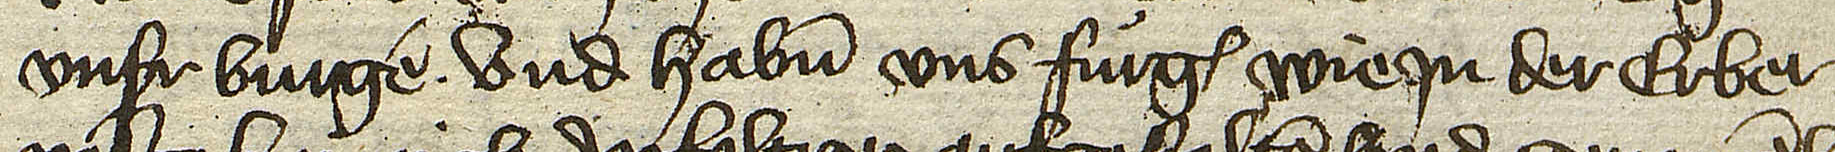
vnſ*r burge* . Vnd habn* vns fürg* wie In der Erber
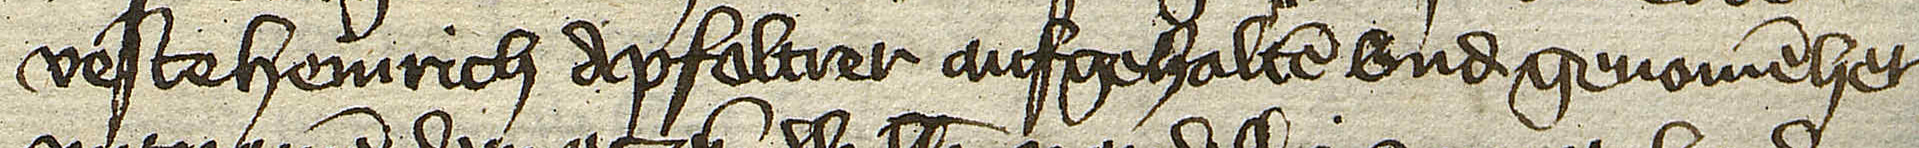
veſte heinrich Apfoltrer aufgehalte* vnd genome* het
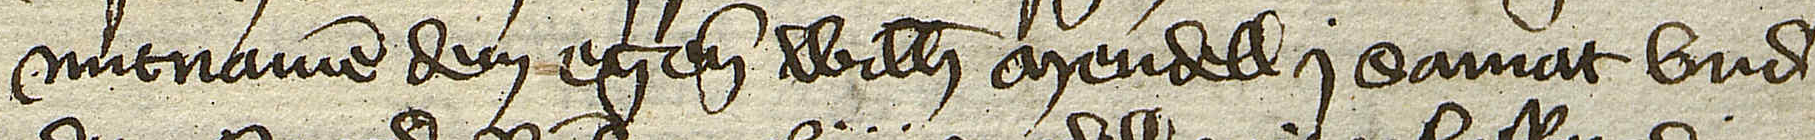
mitname* dem egen* Wilh* Mendell i Samat vnd
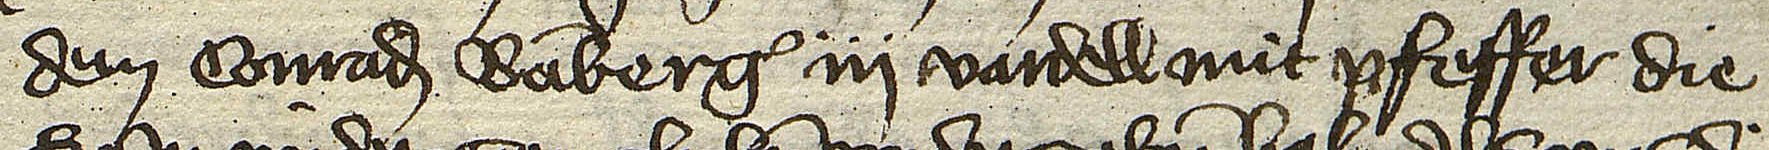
dem Conrad* Ba*berg* iii vardell mit pfeffer die
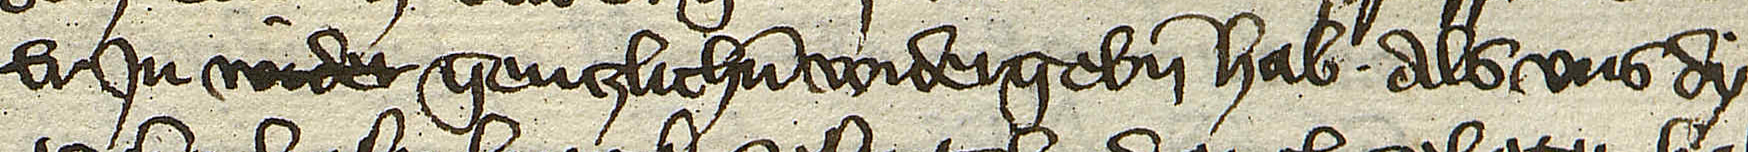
Er In wider gencʒlichn* widergebn* hab . Als vns dy
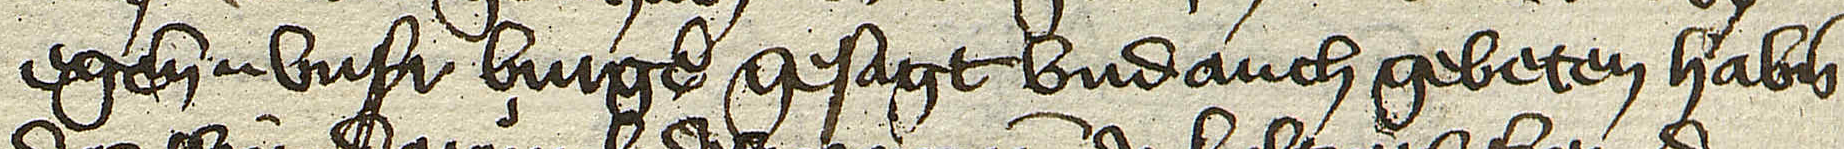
egen* ~ vnſ*r burge* geſagt vnd auch gebeten habn*
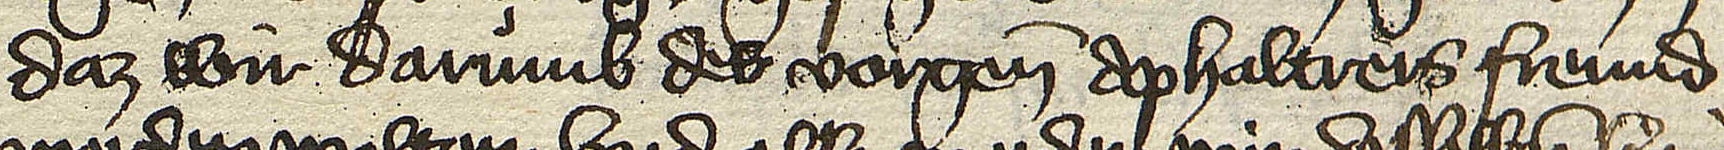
daʒ wir darümb des vorgen* Aphaltrers freund
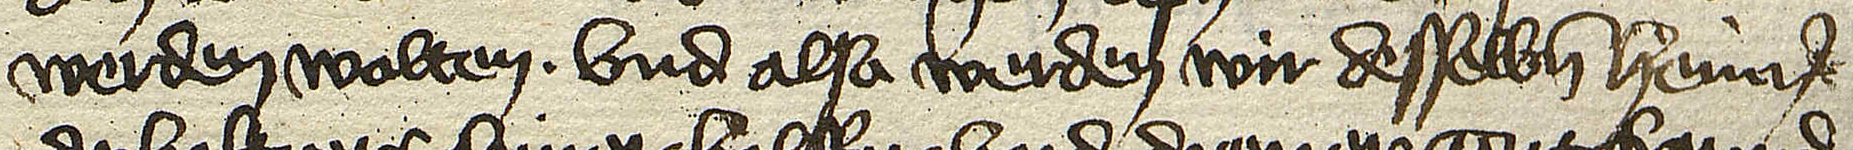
werden wolten . vnd alſo werden wir deſſelbn* heinr*
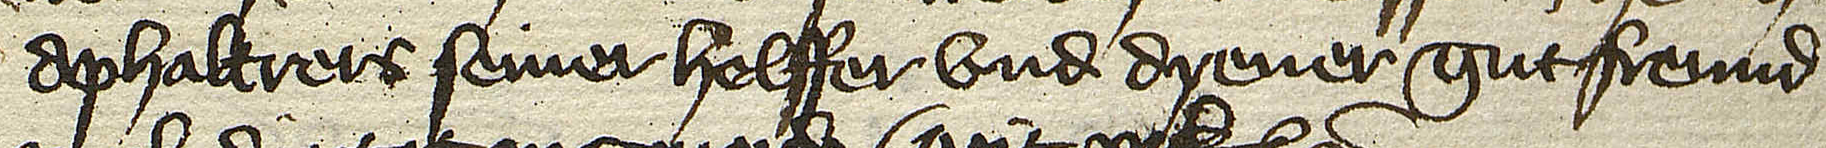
Aphaltrers ſeiner helffer vnd dyener gut freund
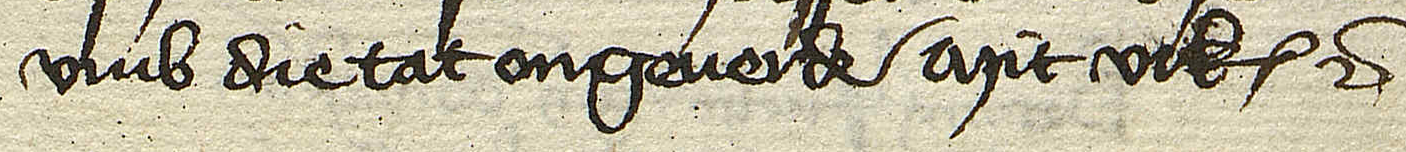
vmb die tat ongeuerde / Mit vrk* ec*
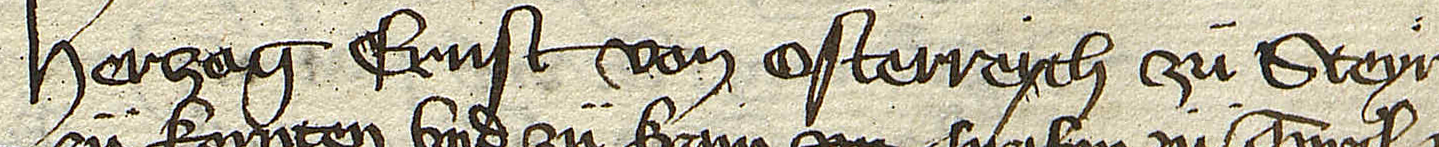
Hercʒog Ernſt von Oſterreych cʒü Steyr
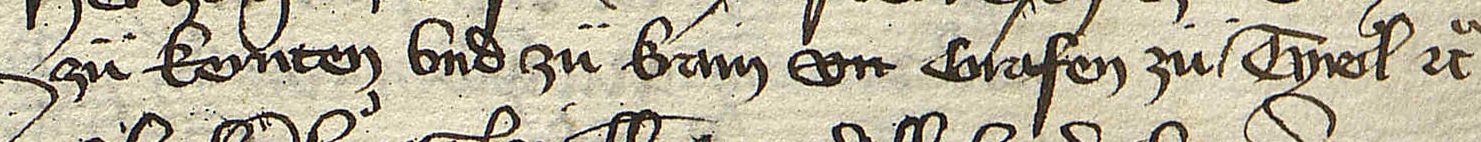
cʒü kernten vnd cʒü krain vn Grafen ʒü Tyrol ec*
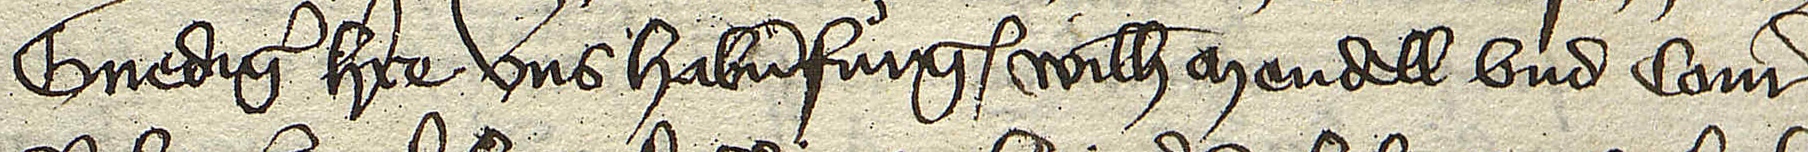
Gnedig* h*re . Vns habn* fürg* wilh* Mendell vnd Conr*
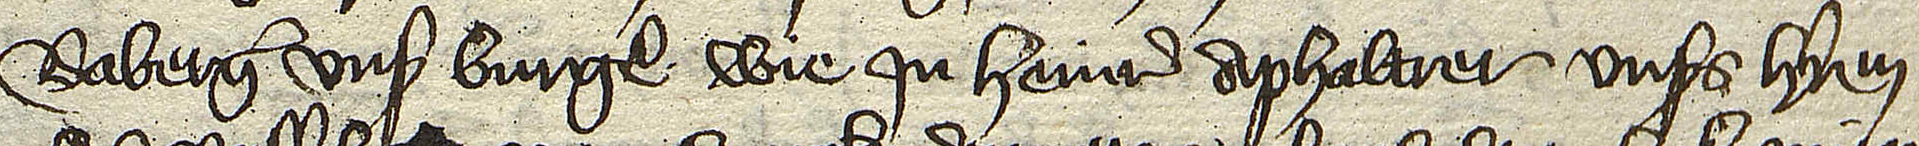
Baberg* vnſ* burge* . wie In heinr* Aphaltrer vnſ*s h*ren
